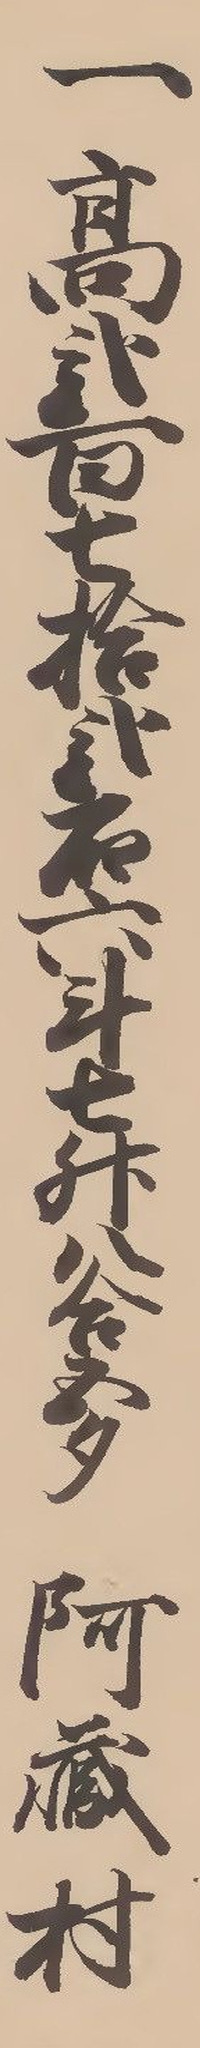一高弐百七拾弐石六斗七升八合五勺阿蔵村
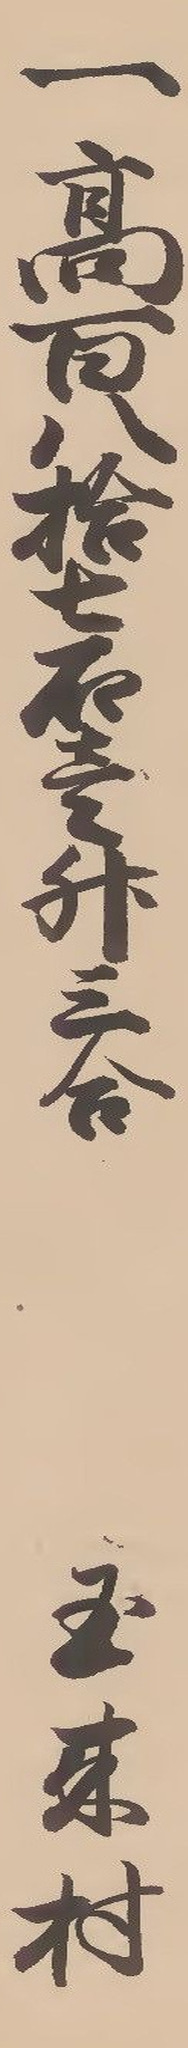一高百八拾七石壱升三合玉来村
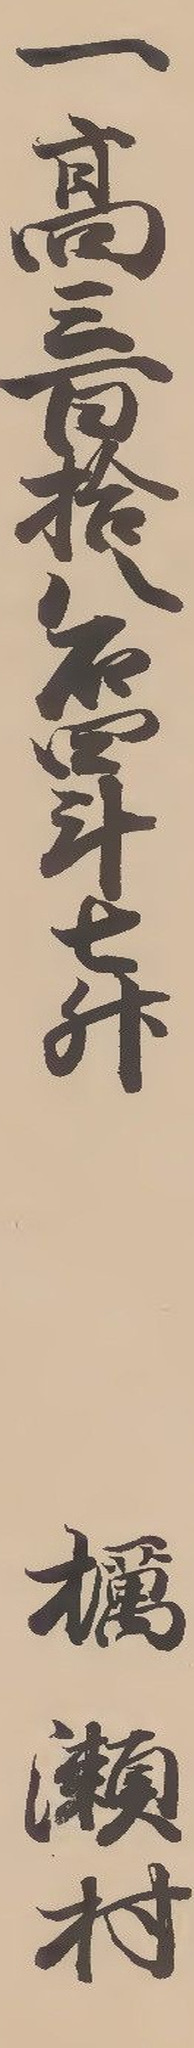一高三百拾八石四斗七升栃瀬村
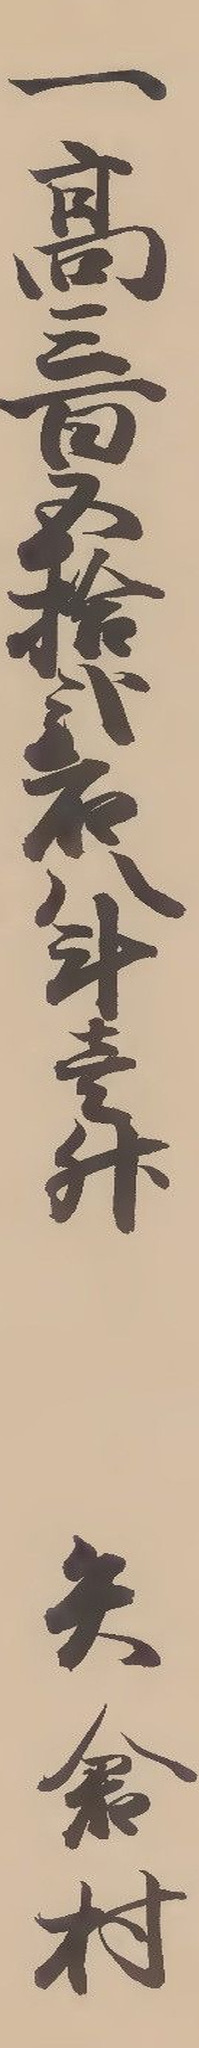一高三百五拾弐石八斗壱升矢倉村
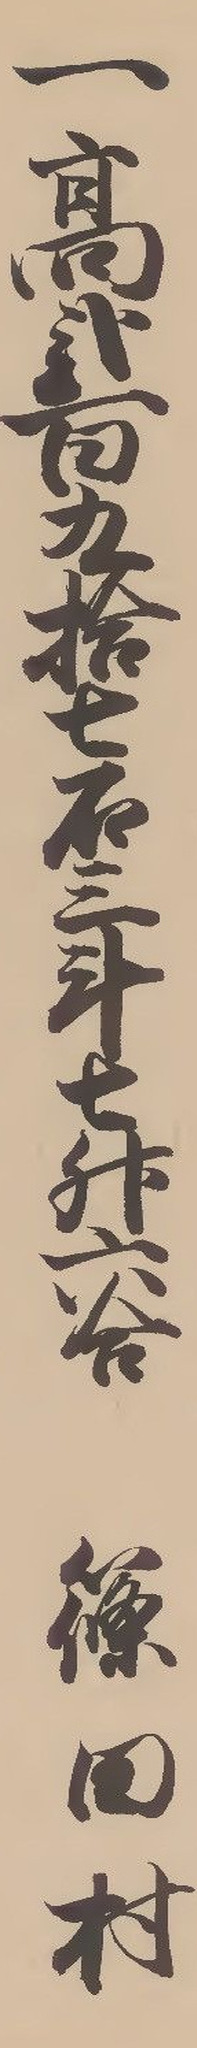一高弐百九拾七石三斗七升六合篠田村
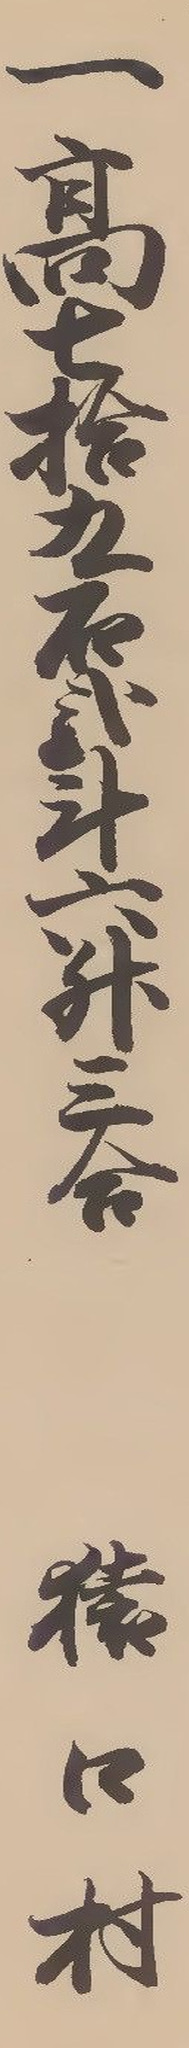一高七拾九石弐斗六升三合猿口村

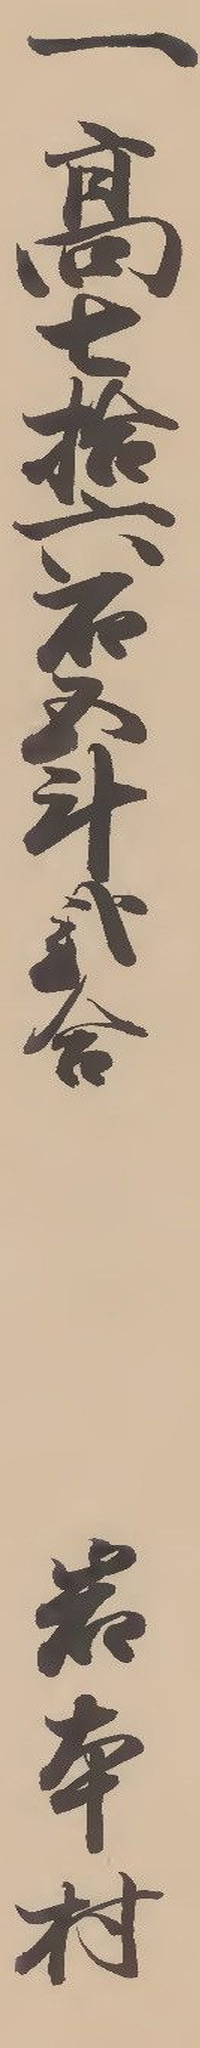一高七拾六石五斗弐合岩本村
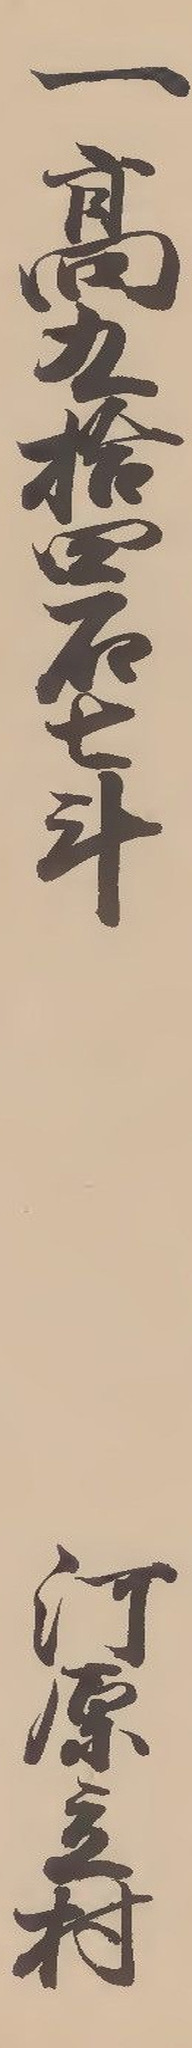一高九拾四石七斗河原立村
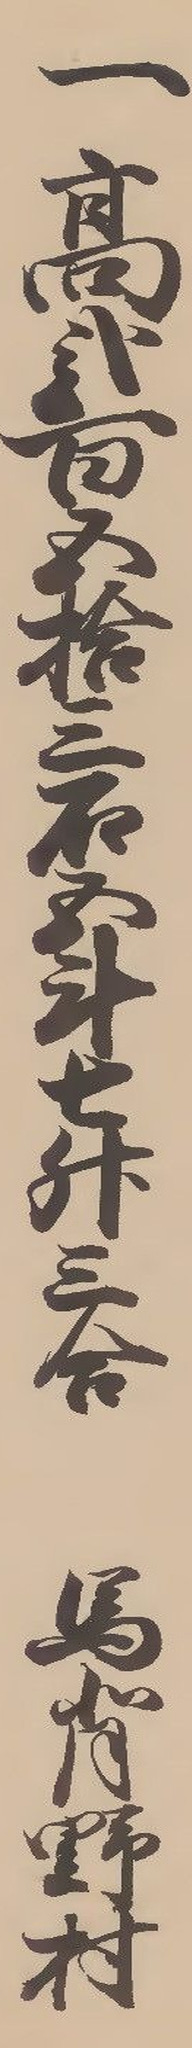一高弐百五拾三石五斗七升三合馬背野村
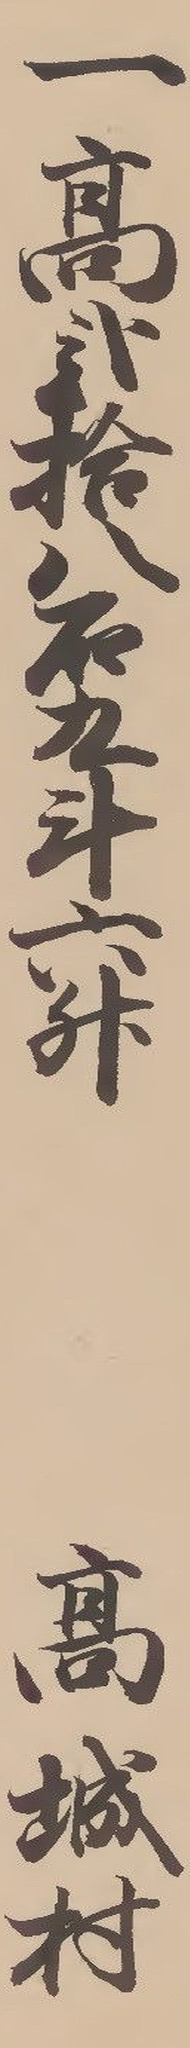一高弐拾八石九斗六升高城村
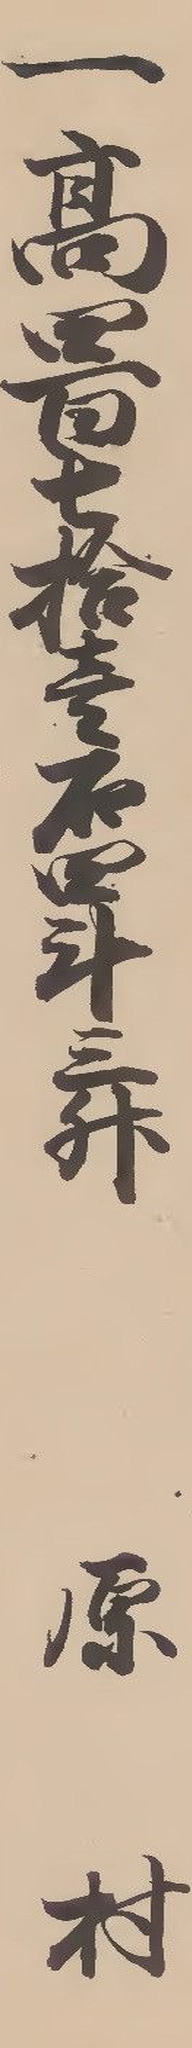一高四百七拾壱石四斗三升原村
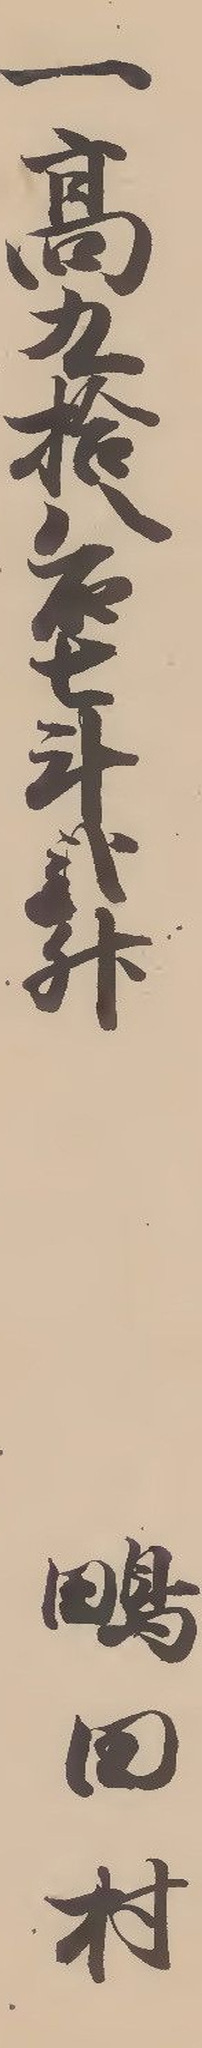一高九拾八石七斗弐升鴫田村
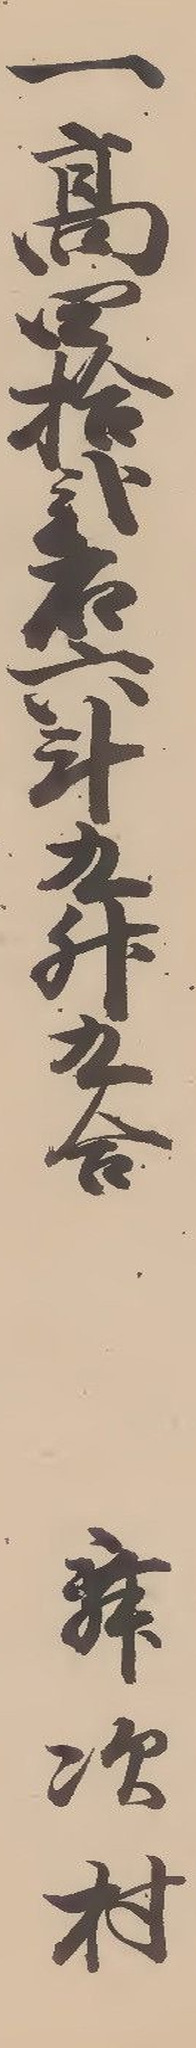一高四拾弐石六斗九升九合舞次村
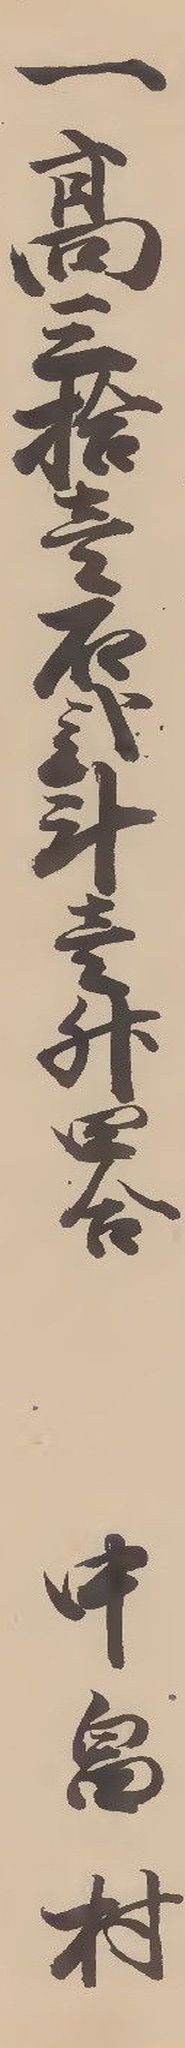一高三拾壱石弐斗壱升四合中畠村

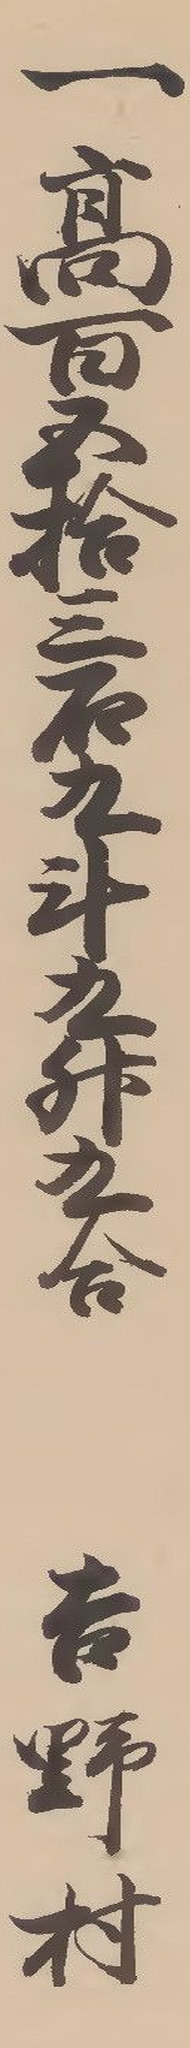一高百五拾三石九斗九升九合吉野村
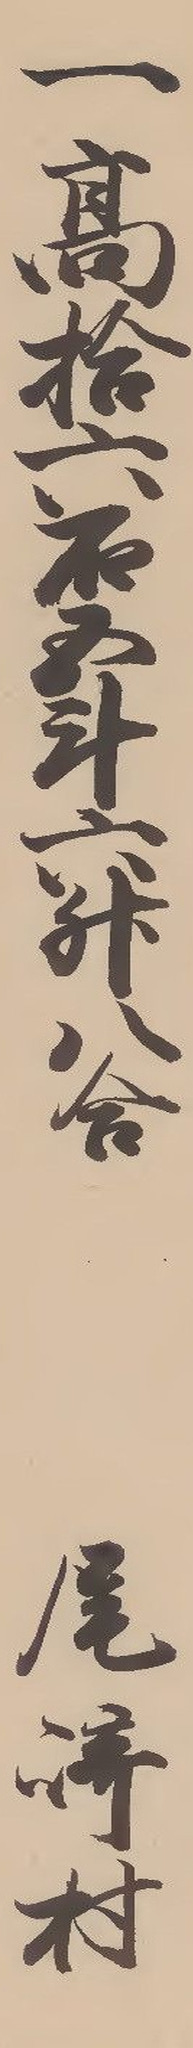一高拾六石五斗六升八合尾崎村
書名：豊後国郷帳
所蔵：国立公文書館 National Archives of Japan
